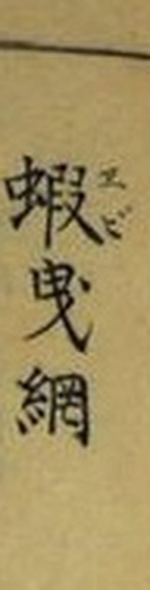蝦曳網

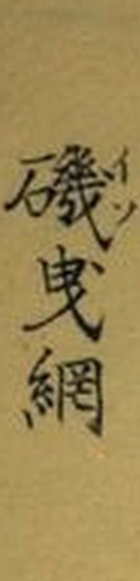磯曳網

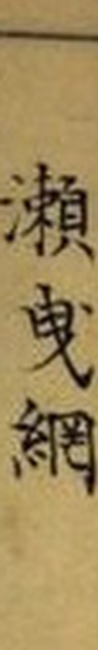瀬曳網

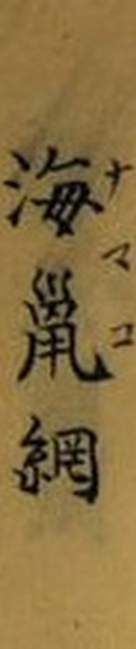海鼠網

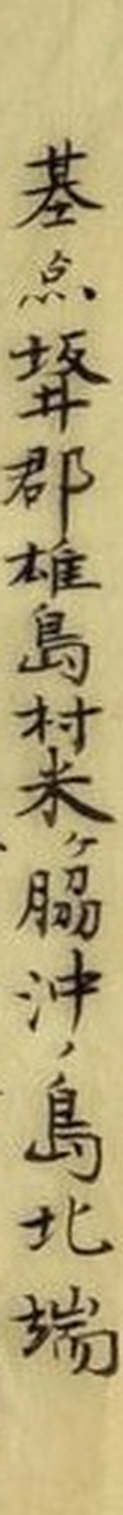基点坂井郡雄島村米ヶ脇沖ノ島北端
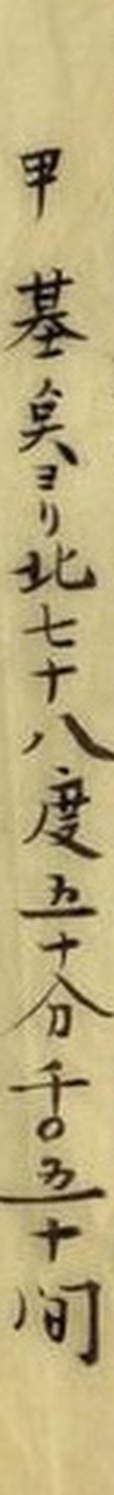甲基点ヨリ北七十八度五十分千〇五十間
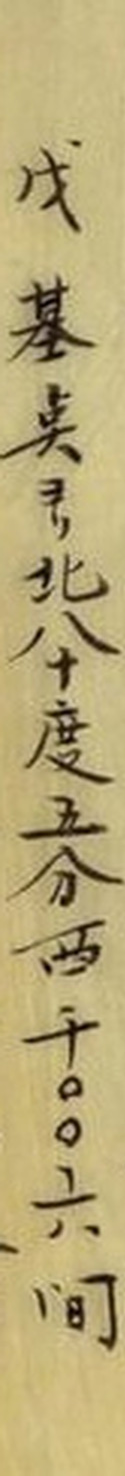戌基点ヨリ北八十度五分西千〇〇六間
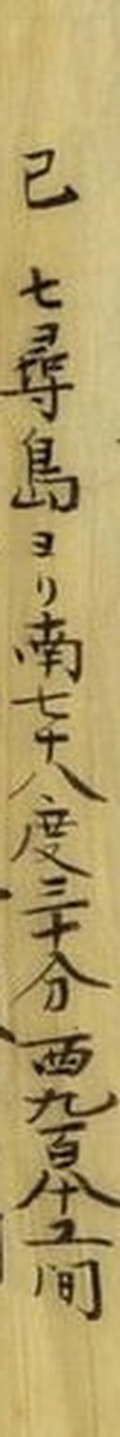巳七尋島ヨリ南七十八度三十分西九百八十二間
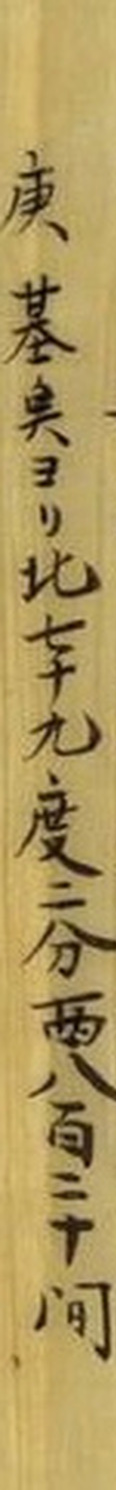庚基点ヨリ北七十九度二分西八百二十間
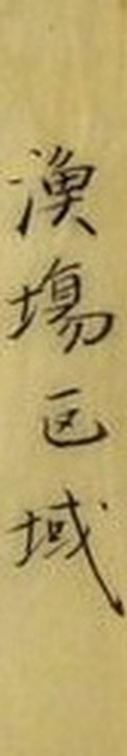漁場区域
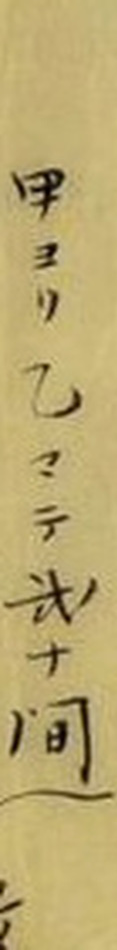甲ヨリ丙マテ二十間
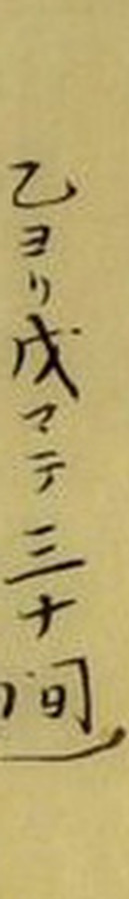乙ヨリ戌マテ三十間
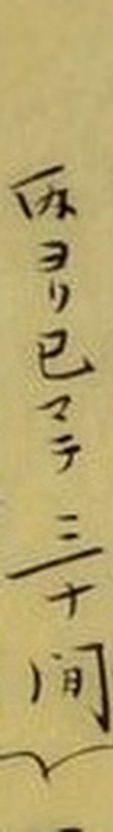乙ヨリ戌マテ三十間
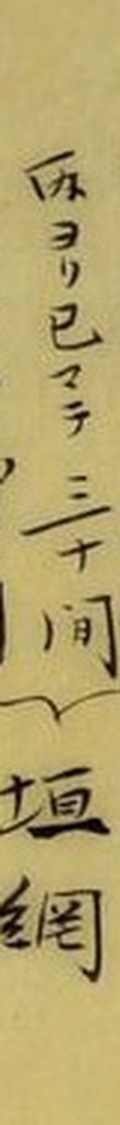丙ヨリ巳マテ三十間垣網
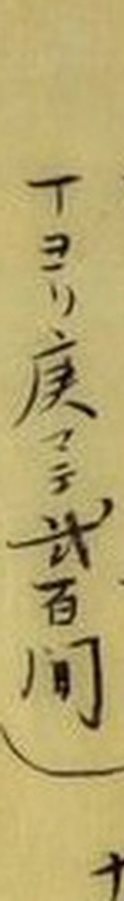丁ヨリ庚マテ二百間
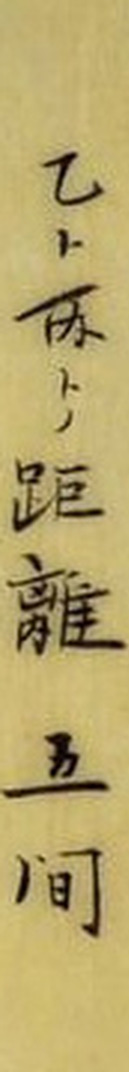乙ト丙トノ距離五間
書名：漁具図 若狭海ノ部[画像あり]
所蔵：福井県文書館 Fukui Prefectural Archives
